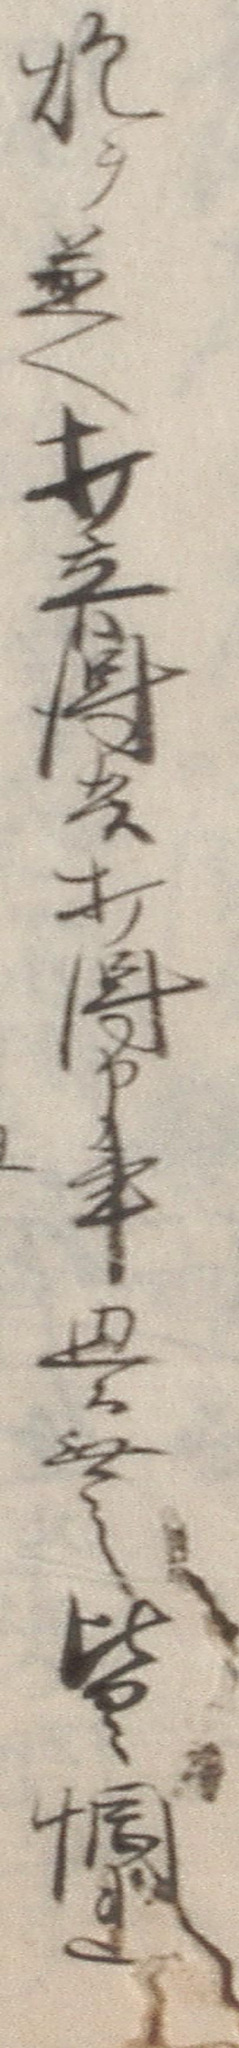砲ヲ並へ打立候得共打得申事廻而無之皆々恫れ
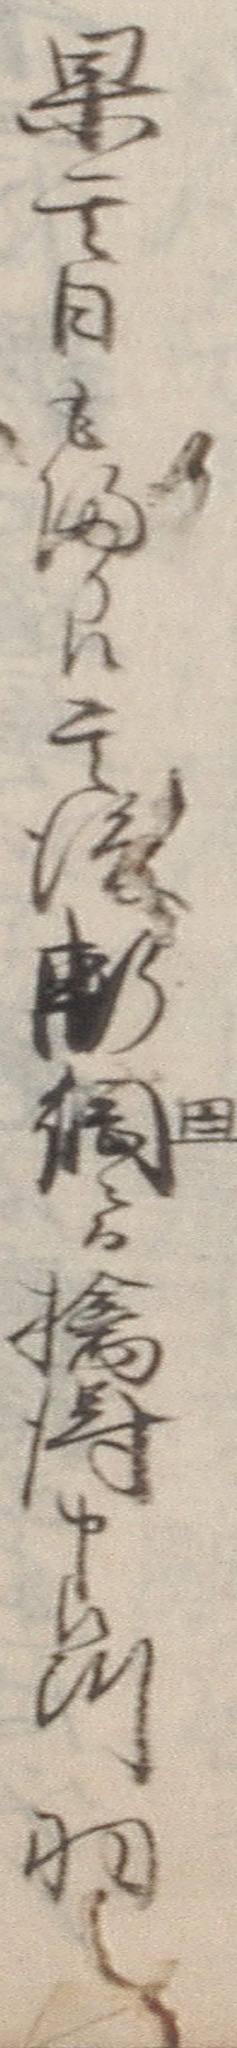果其日も帰り候其後漸調ニ而禽得申候所羽
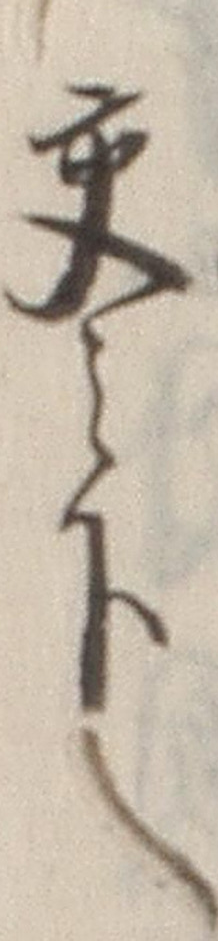交の下
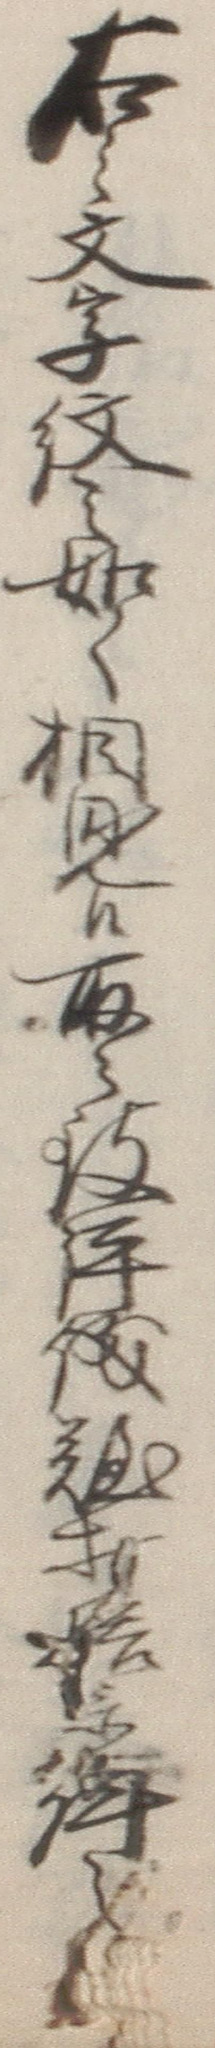右の文字紋之如く相見候取々致評議相難詰置件之
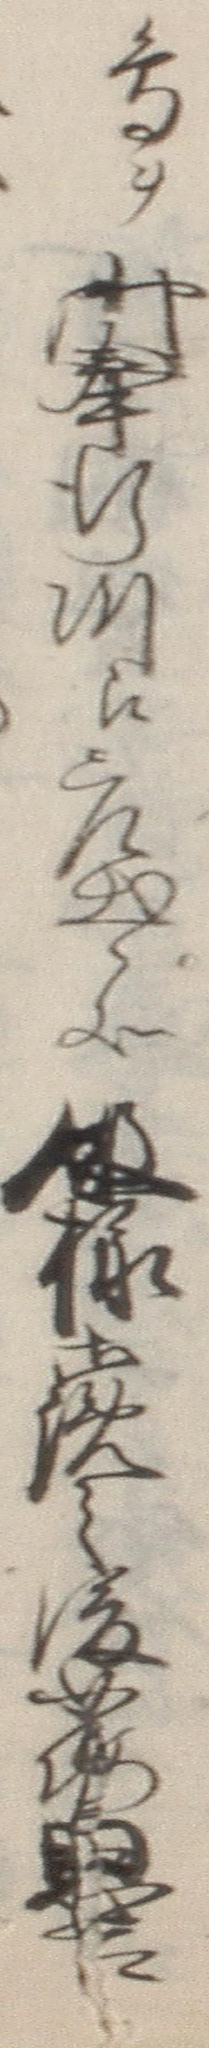鳥ヲ御奉行所え差出候処殿様御覧の後如何思
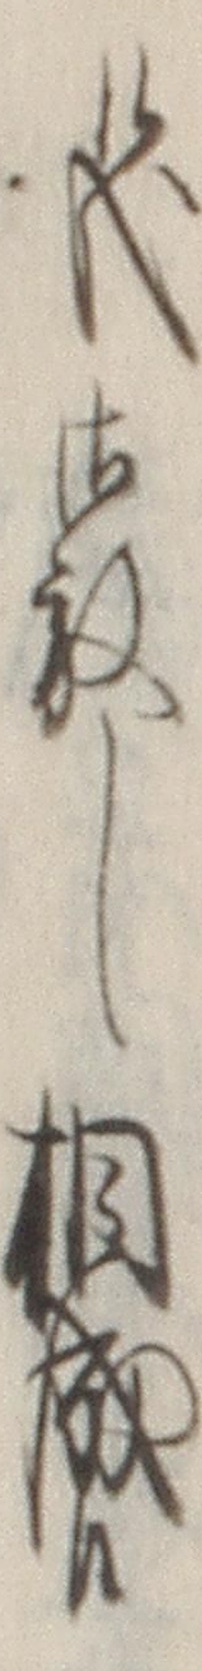候哉御放し相成候
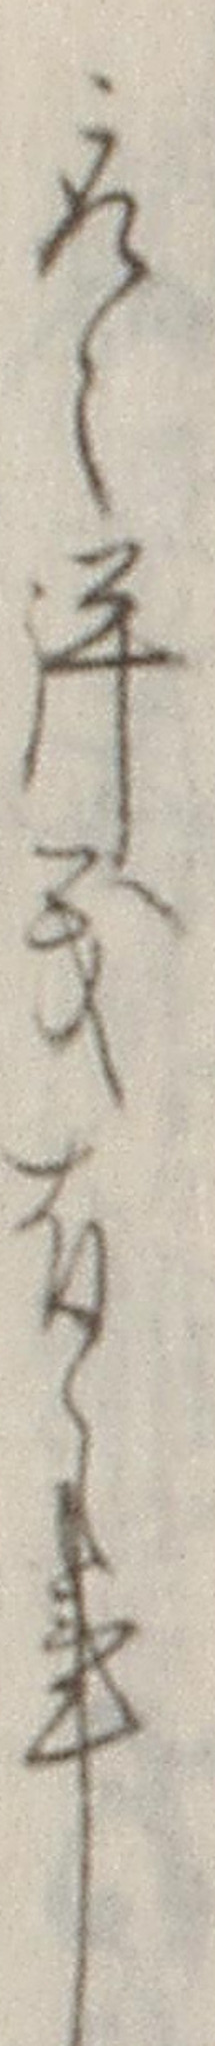取々評義有之候事
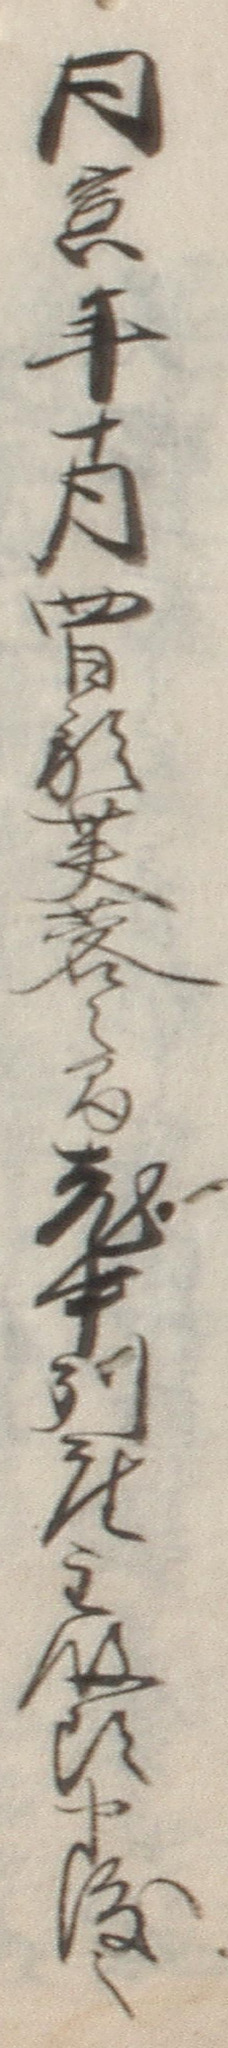同寅年十月四日於芙蓉の間老中列座主殿頭申渡之
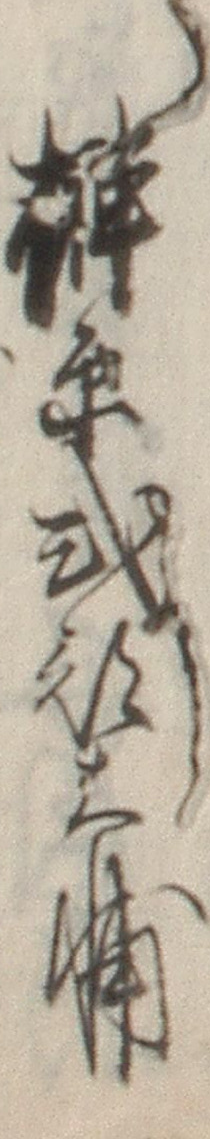榊原式部大輔
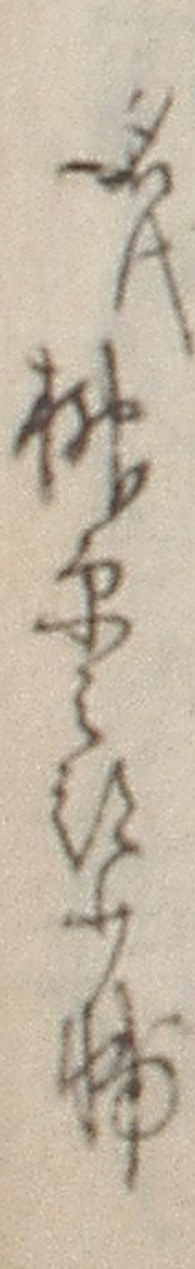榊原式部大輔

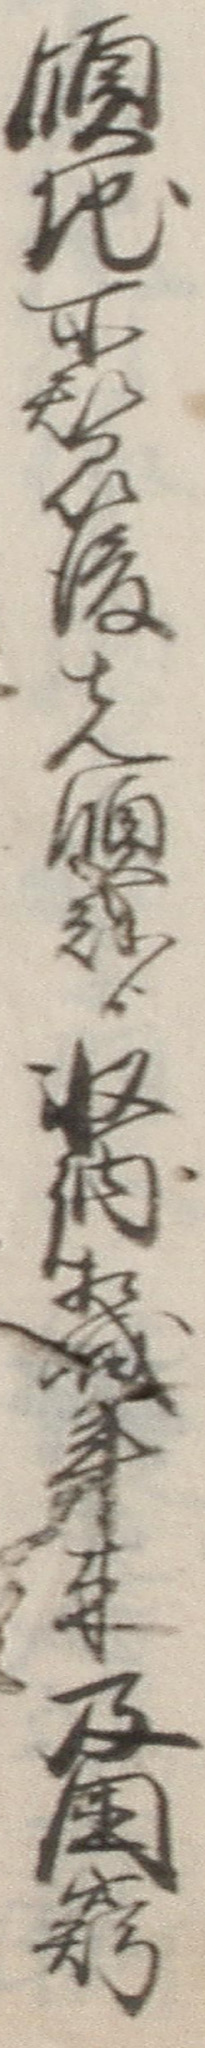領地所替以後先領知ゟ収納相減年来及困窮
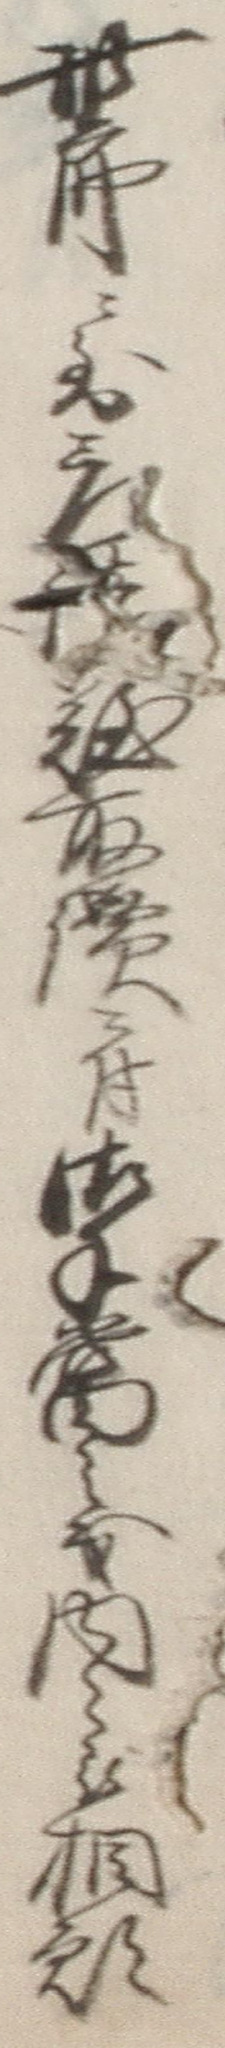此節ニ至差難取続ニ付御手当之義内々被相願
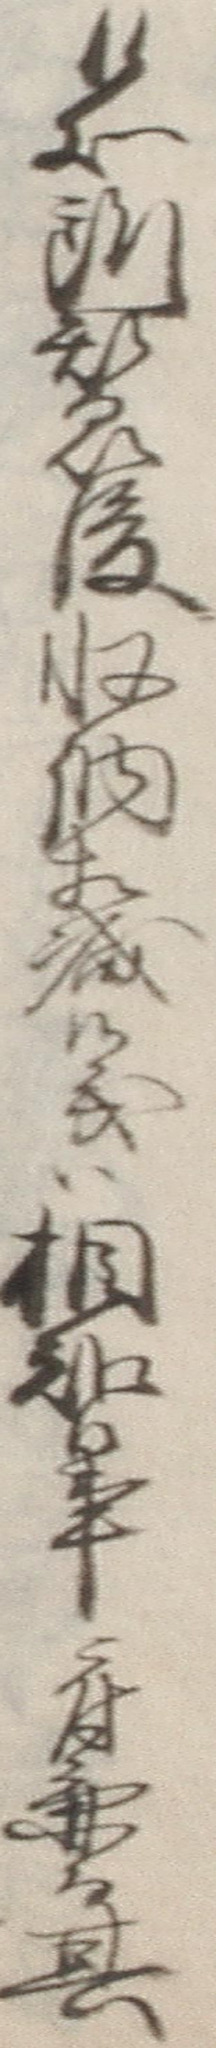候処所替以後収納相減候義ハ相知候事ニ付兼而其
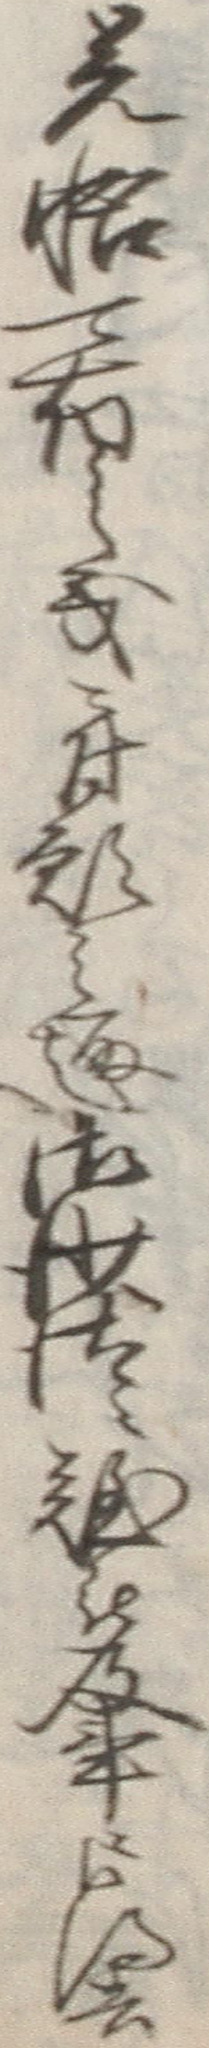覚悟可有之義ニ付願之趣御沙汰ニ難被及事二候得共
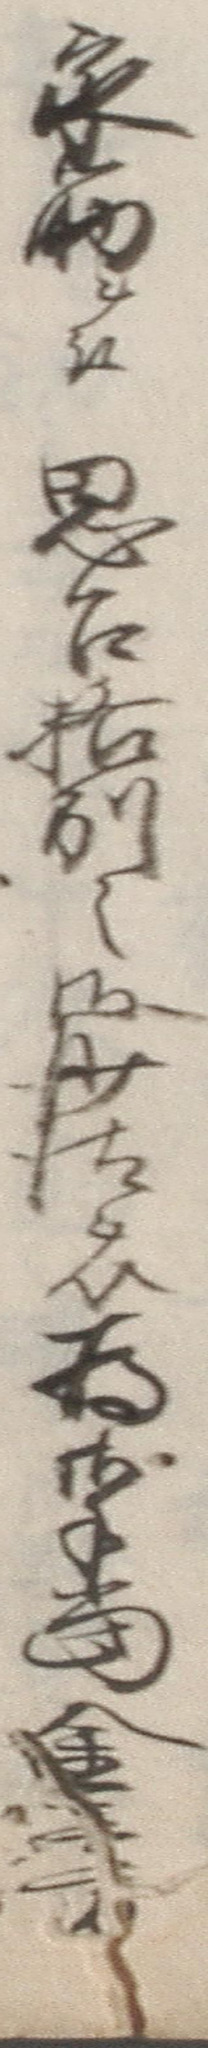家筋ヲ被思召格別之御沙汰ヲ以為御手当金壱万
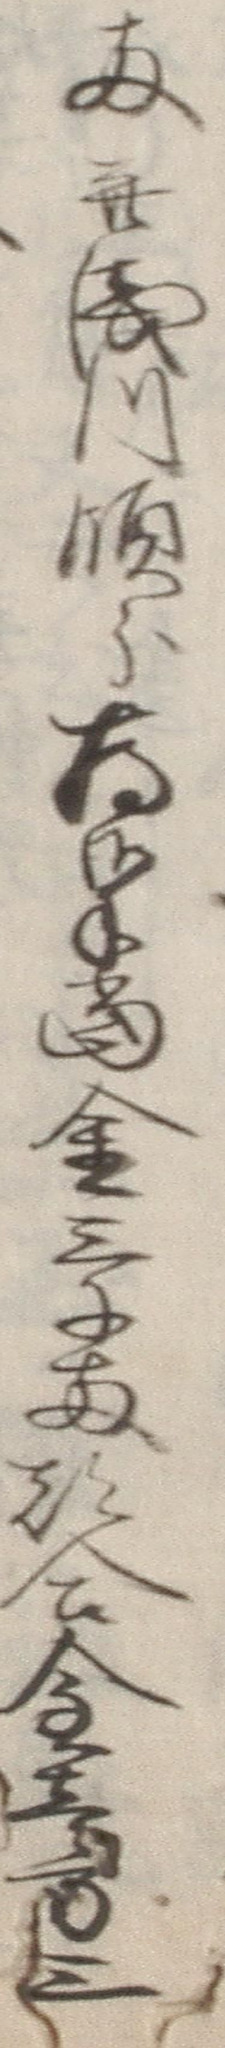両幷浅川領分為御手当金三千両都合金壱万三
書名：[諸国災害記録]
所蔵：東京大学地震研究所図書室 Earthquake Research Institute Library, The University of Tokyo, JAPAN
